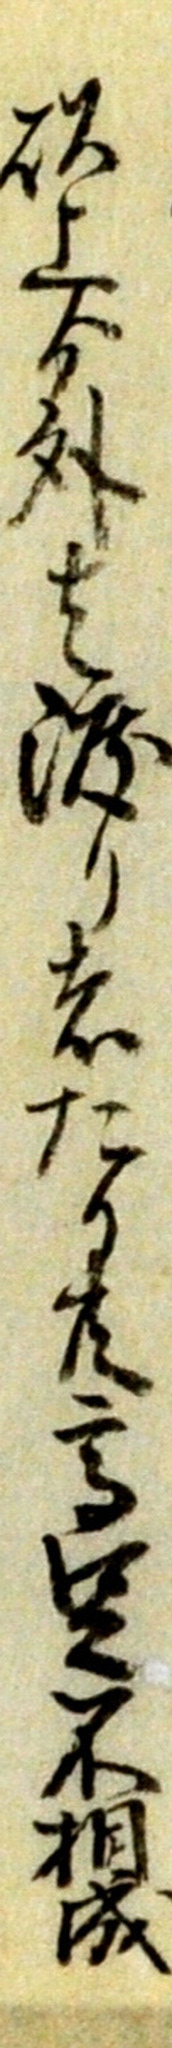以上ゟ外者渡りしたり共高足不相成
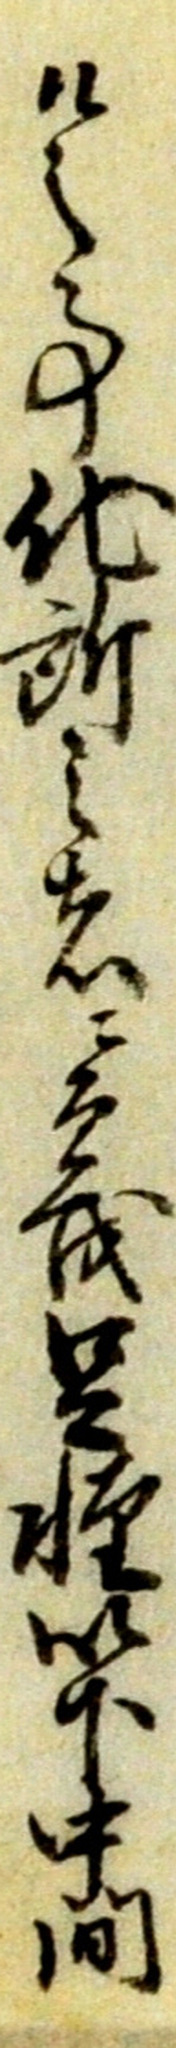候之事他所之者ニ而茂足軽以下中間
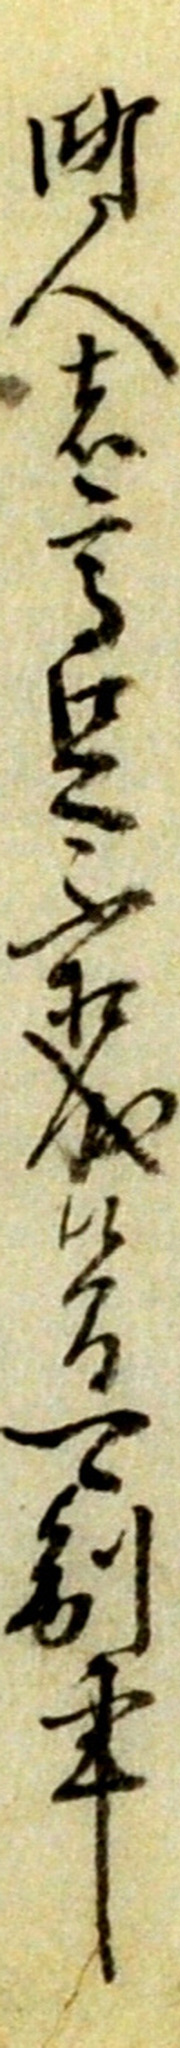町人者高足不相成候間可別事
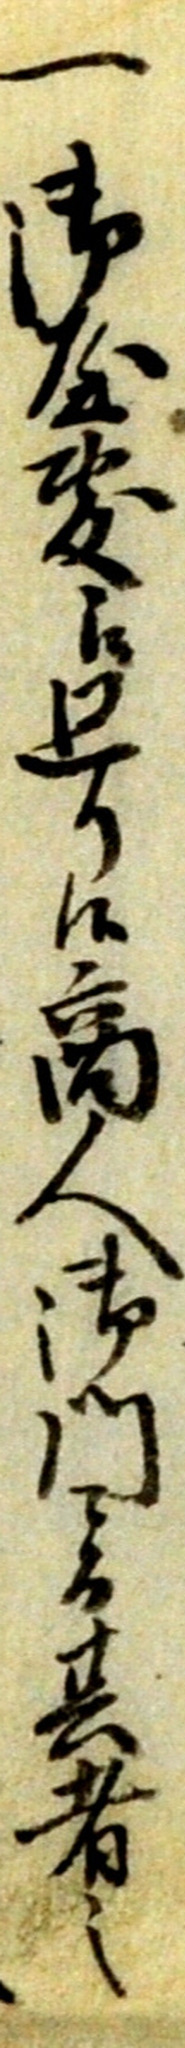一御屋敷江廻り候商人御門ニ而其者之
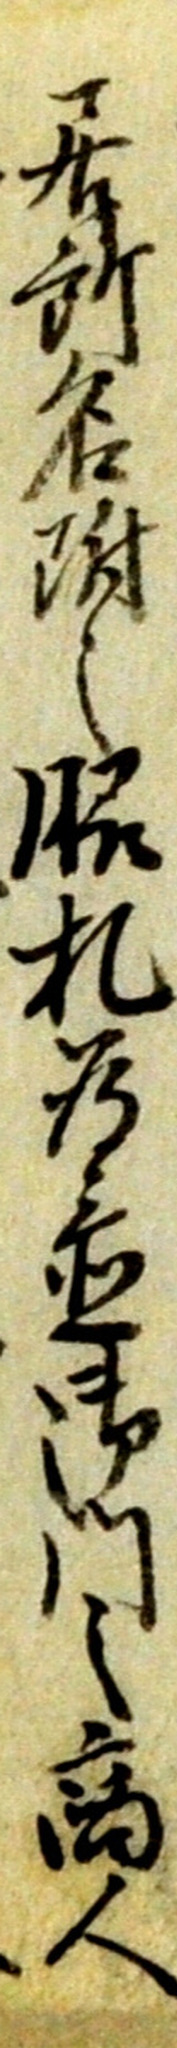居所名附之脇札為置御門之商人
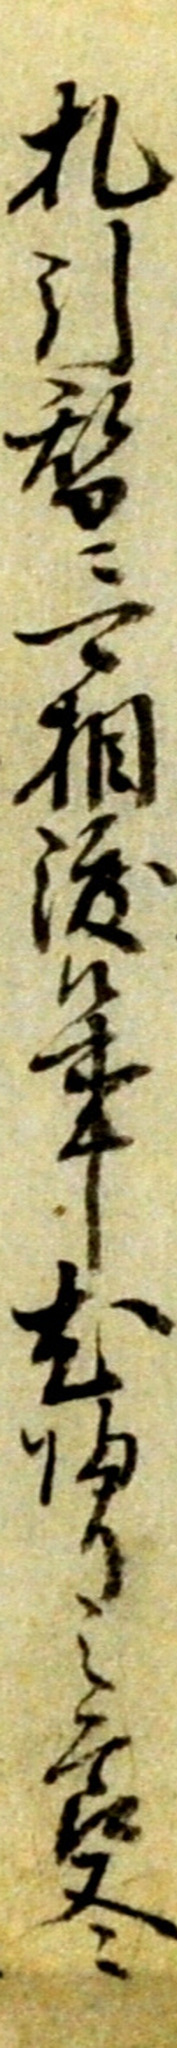札引替ニ可相渡候事尤帰り之節又々
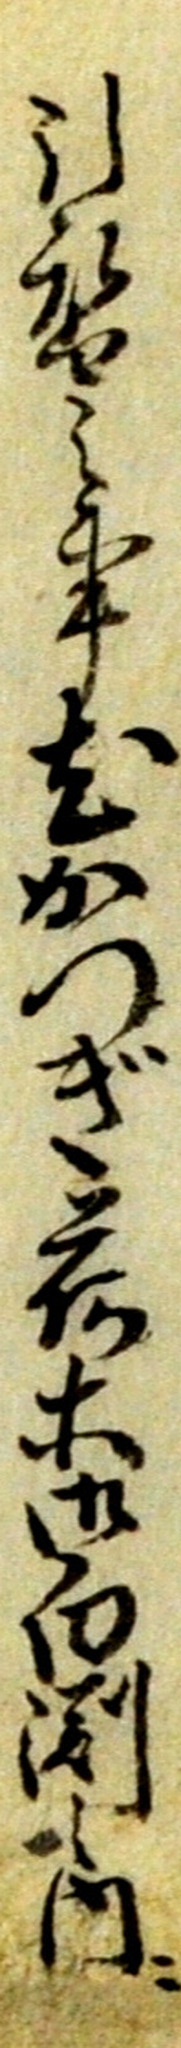引替之事尤かつぎ荷等御白渕之内ニ
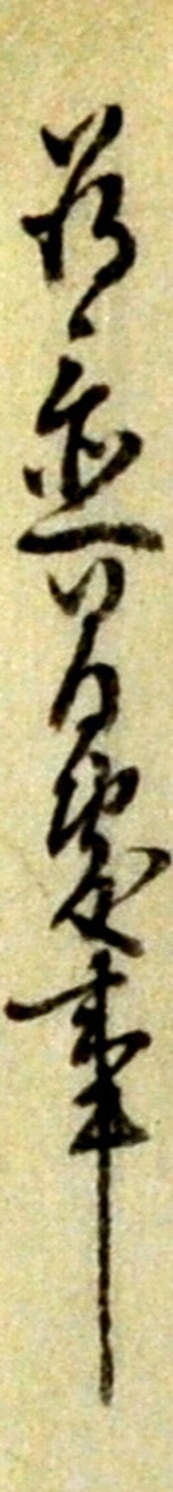為置間処事

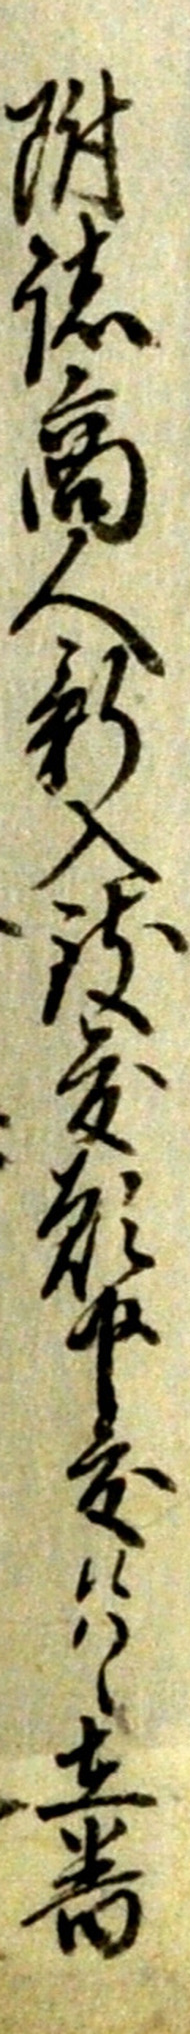附諸商人新入致度願申度候ハヽ在番
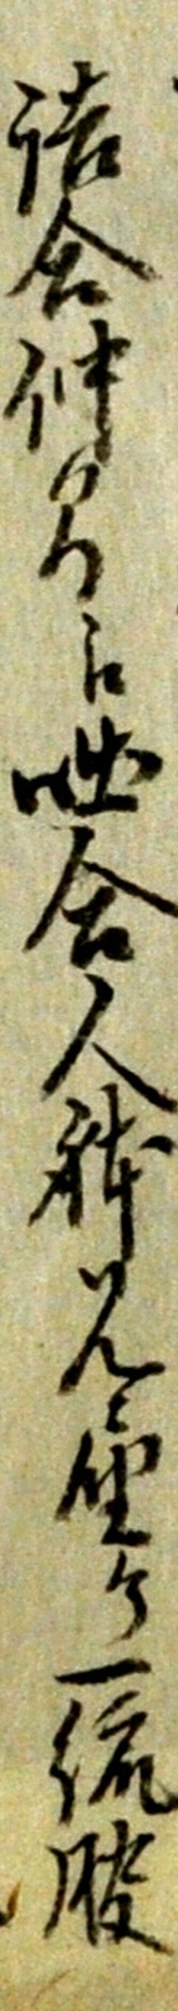請合仲間江咄合人体見届ケ一統腹
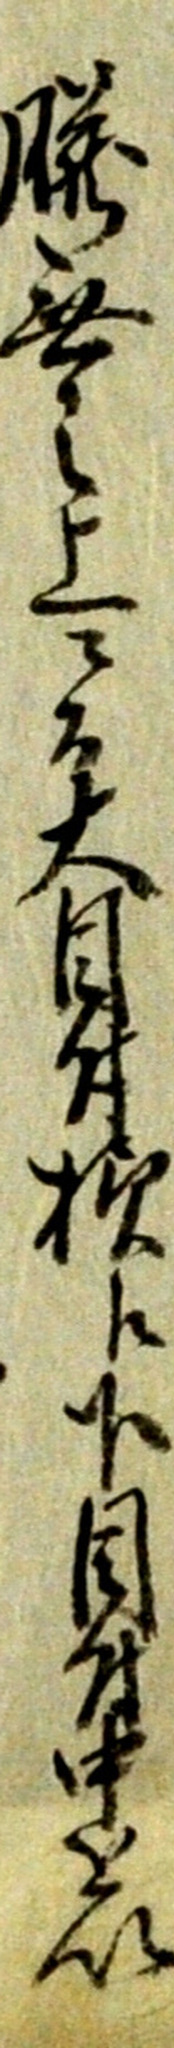蔵無之上ニ而大目付様江下目付中を以
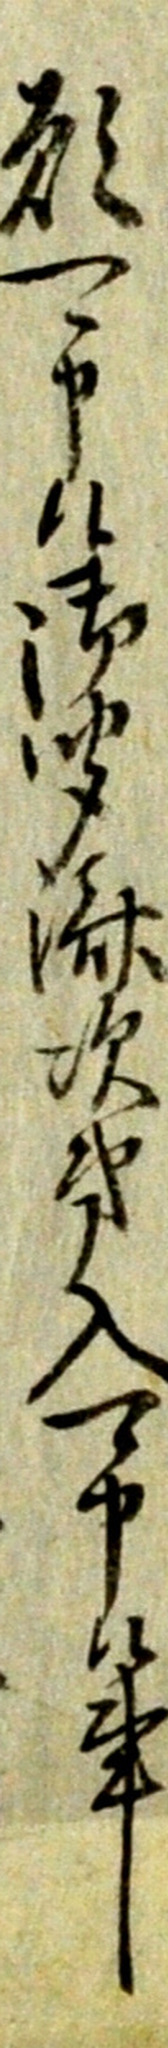願可申候御聞済次第入可申候事
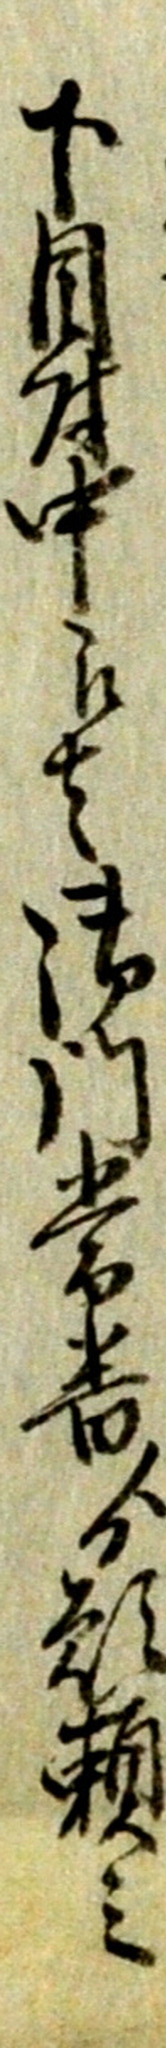下目付中江者御門常番ゟ願頼ミ
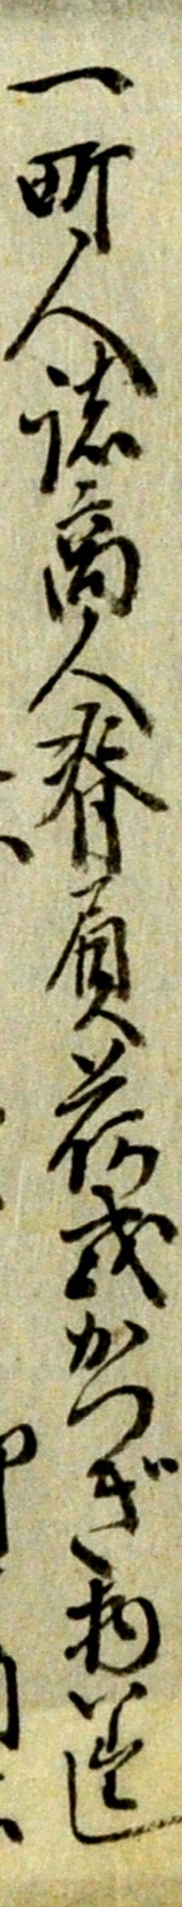一町人諸商人背負荷或かつぎ物いたし
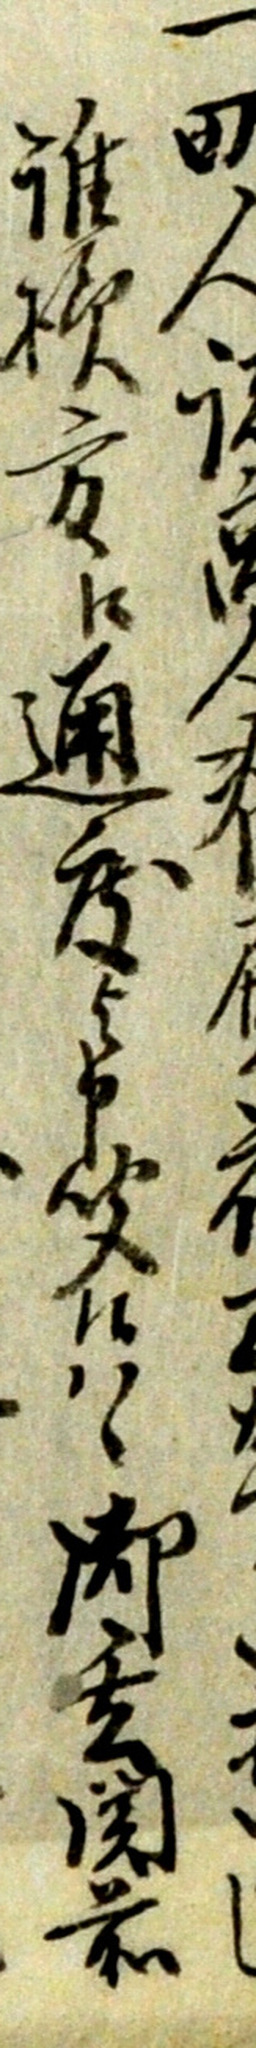誰様方江通度と申聞候ハヽ御玄関前
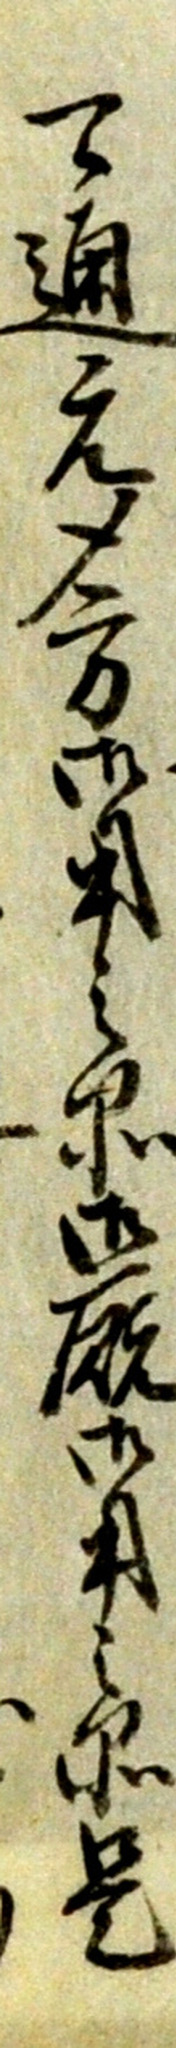可通元〆方御用之品御厩御用之品是
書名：御先手組江戸御屋敷御門番勤方
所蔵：伊那市立高遠町図書館・合同会社AMANE
